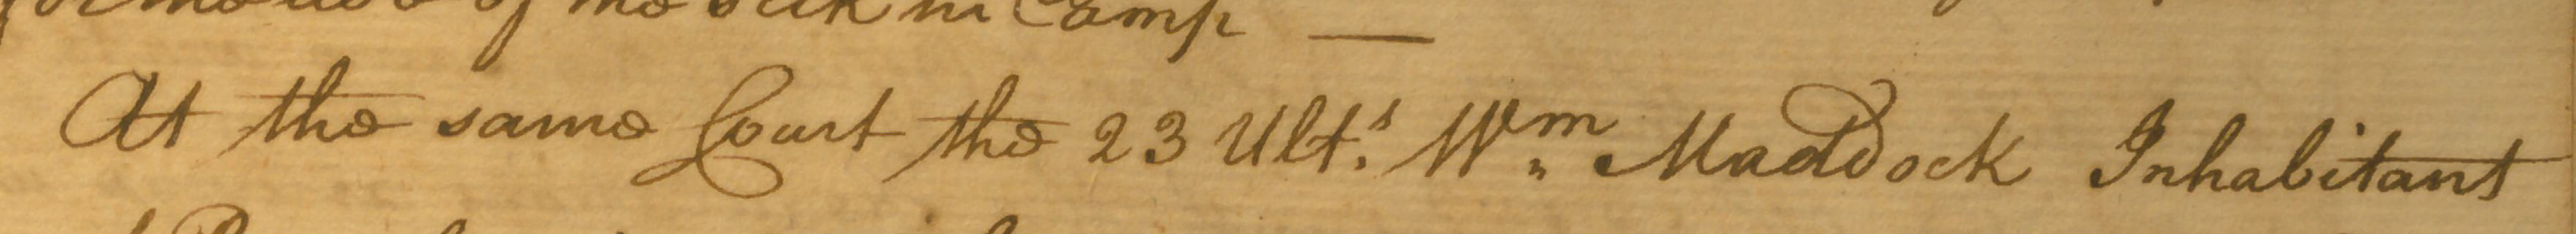At the same Court the 23 Ult^s. W^m. Maddock Inhabitant
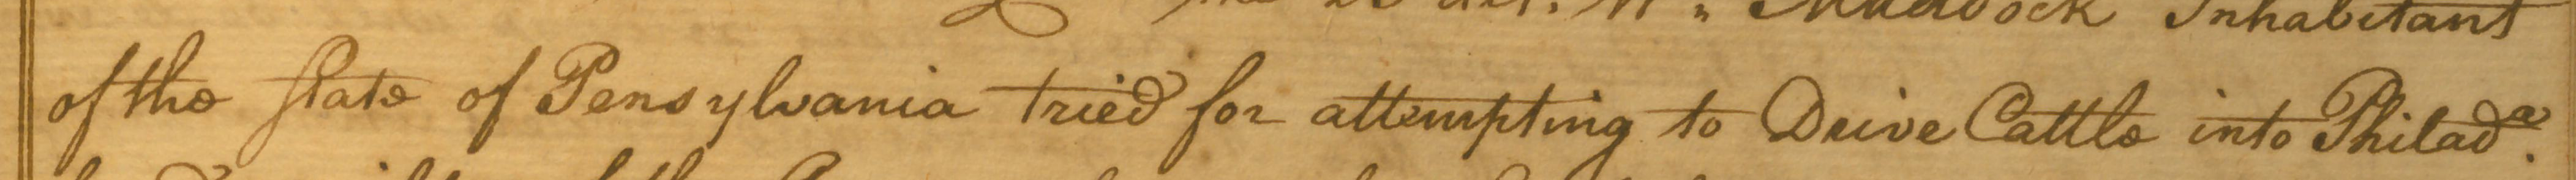of the state of Pensylvania tried for attempting to Drive Cattle into Philad^a.
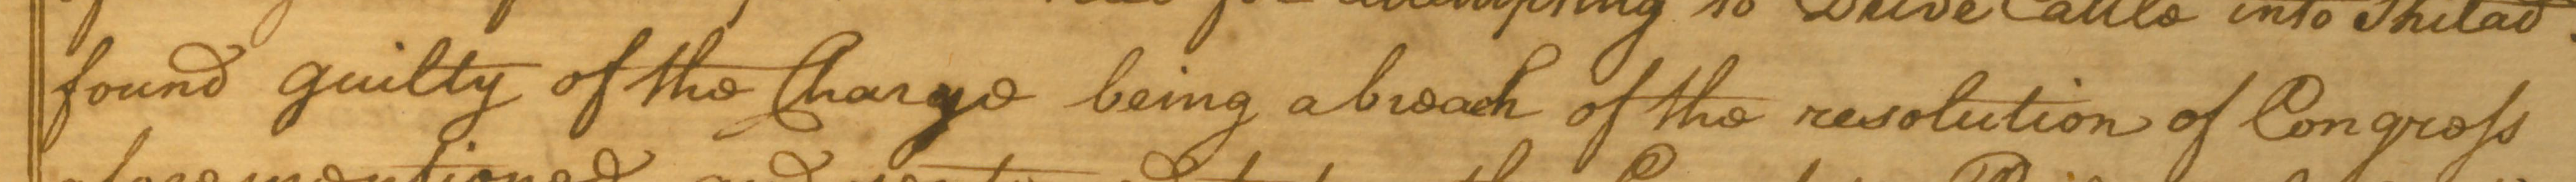found guilty of the Charge being a breach of the resolution of Congress
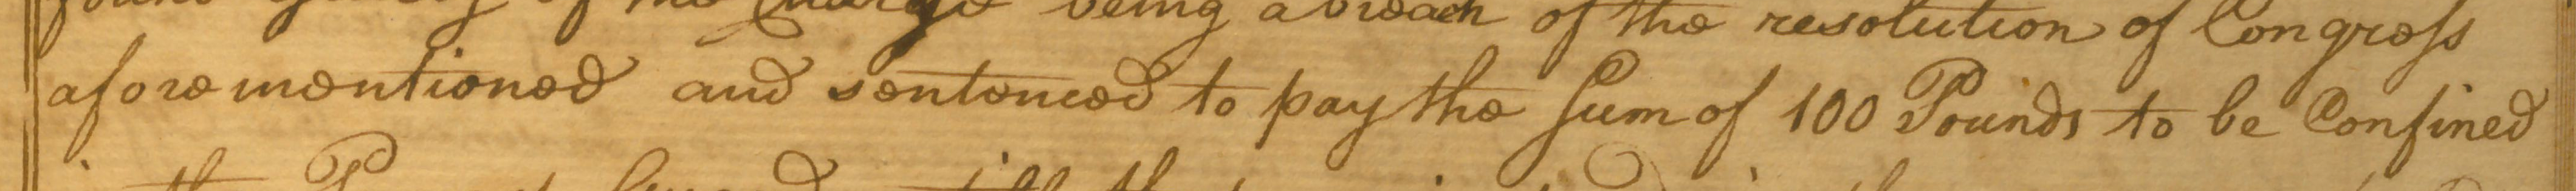aforementioned and sentenced to pay the sum of 100 Pounds to be Confined
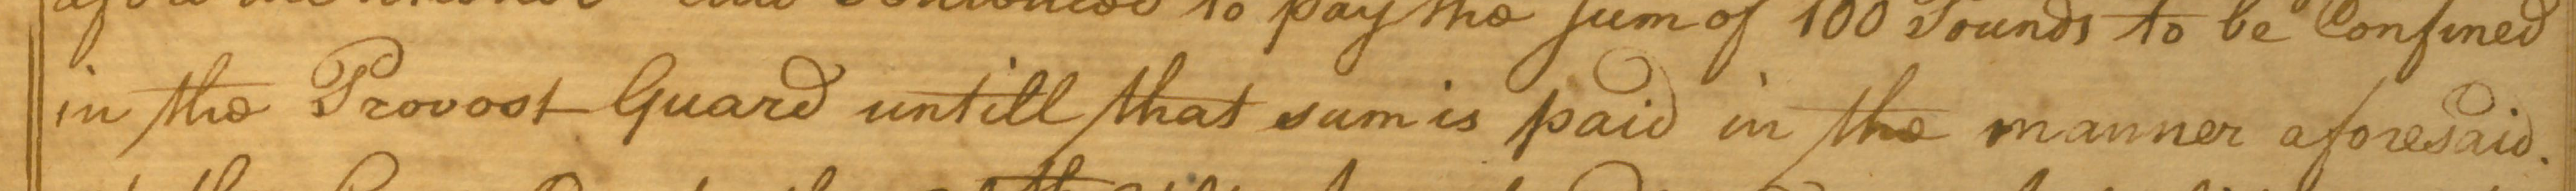in the Provost Guard until that sum is paid in the manner aforesaid.
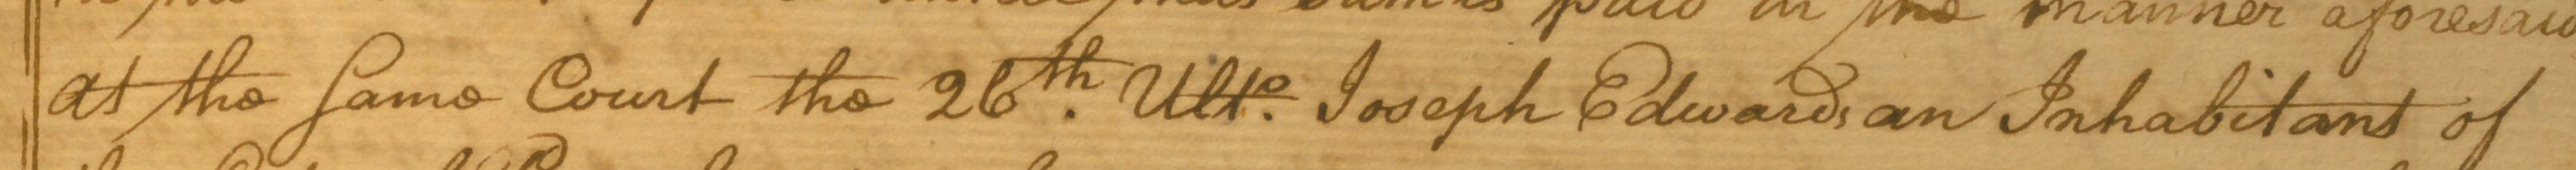At the same Court the 26^th. Ult^o. Joseph Edwards an Inhabitant of
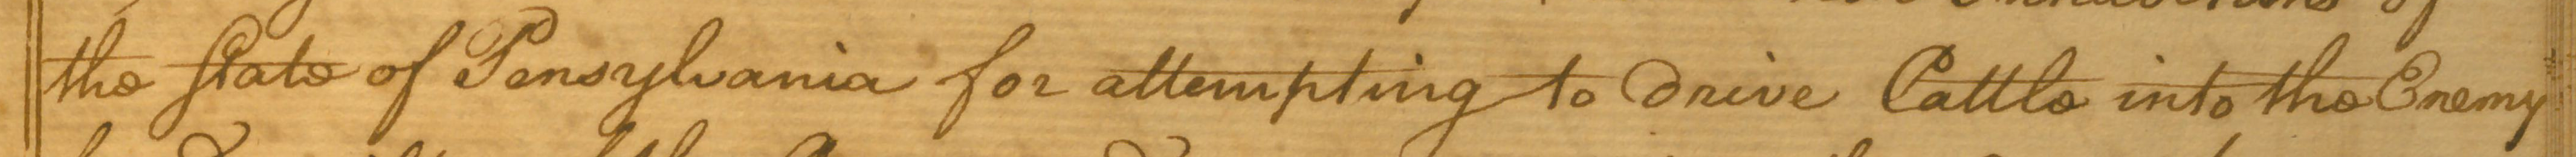the state of Pensylvania for attempting to drive Cattle into the Enemy
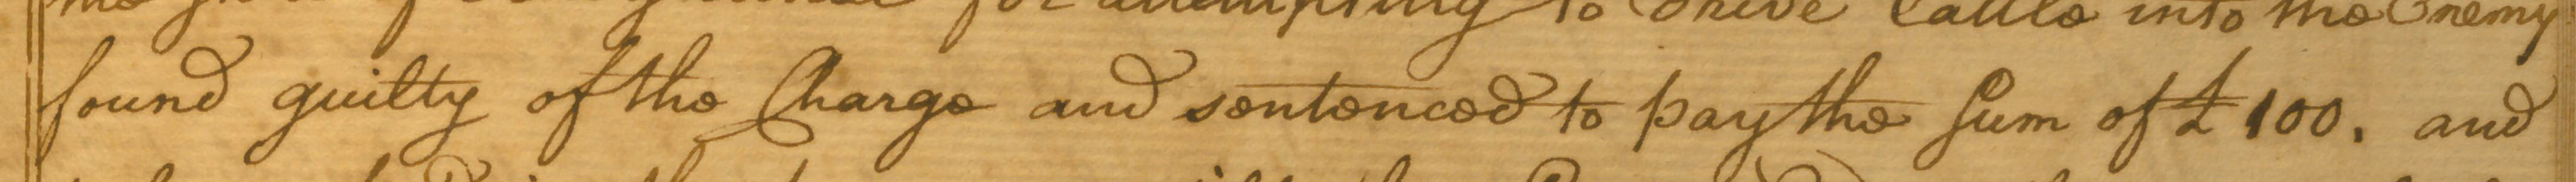found guilty of the Charge and sentenced to pay the sum of £100. and
